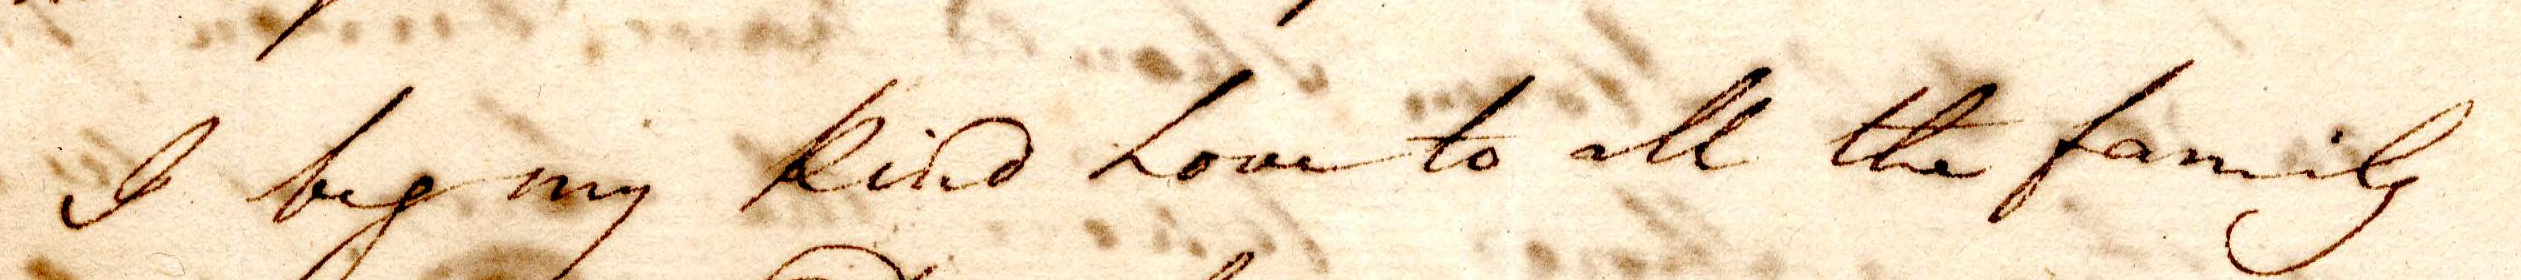I beg in my kind Love to all the family
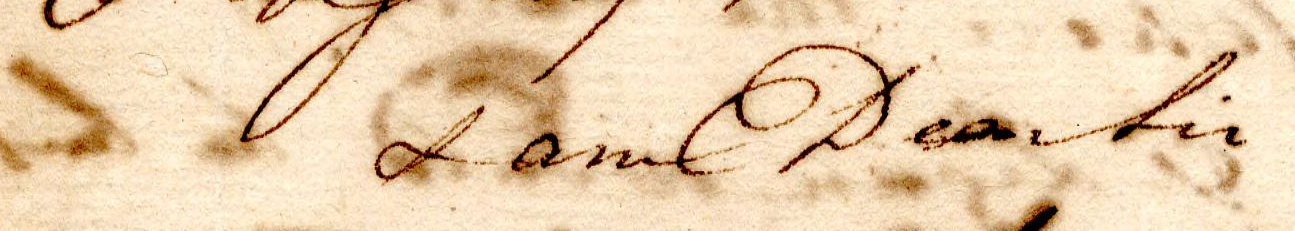I am Dear Sir
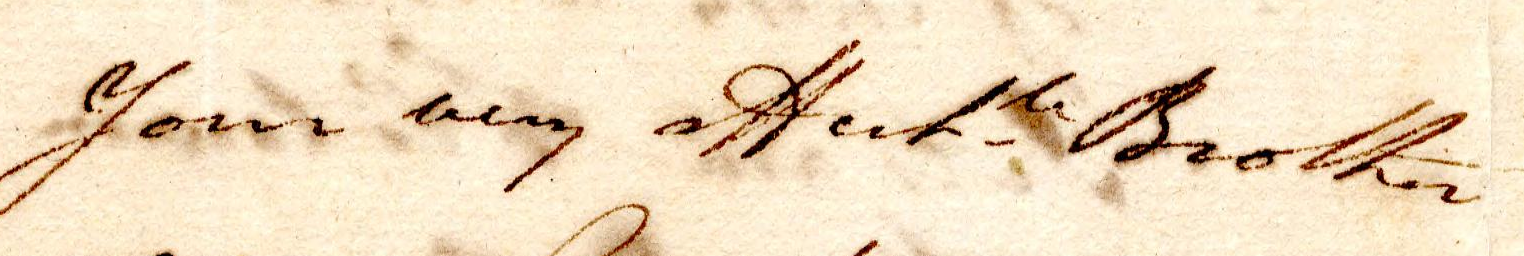Your very affect^e Brother
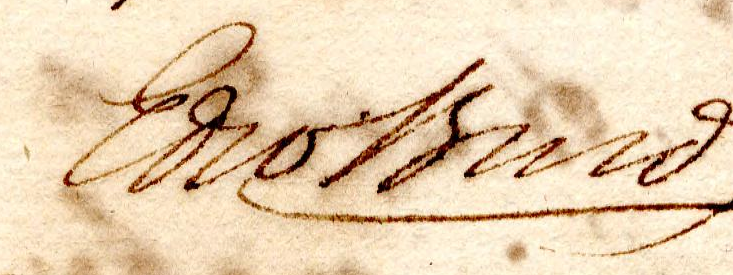Edw. Burd
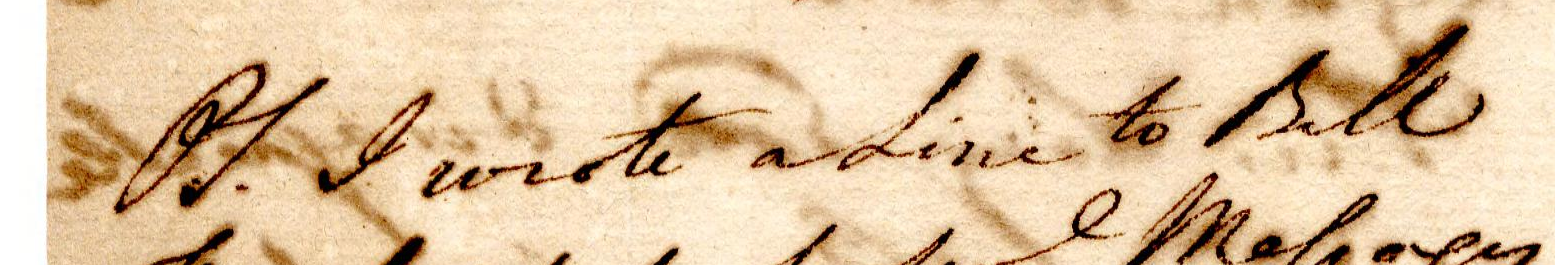PS. I wrote a Line to Bill
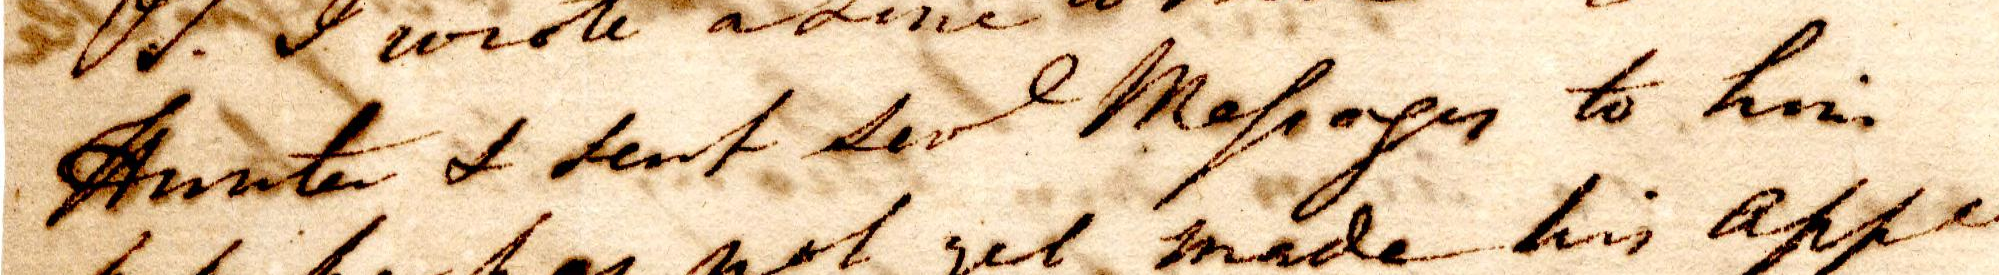Hunter & sent Sev^l Messages to him.
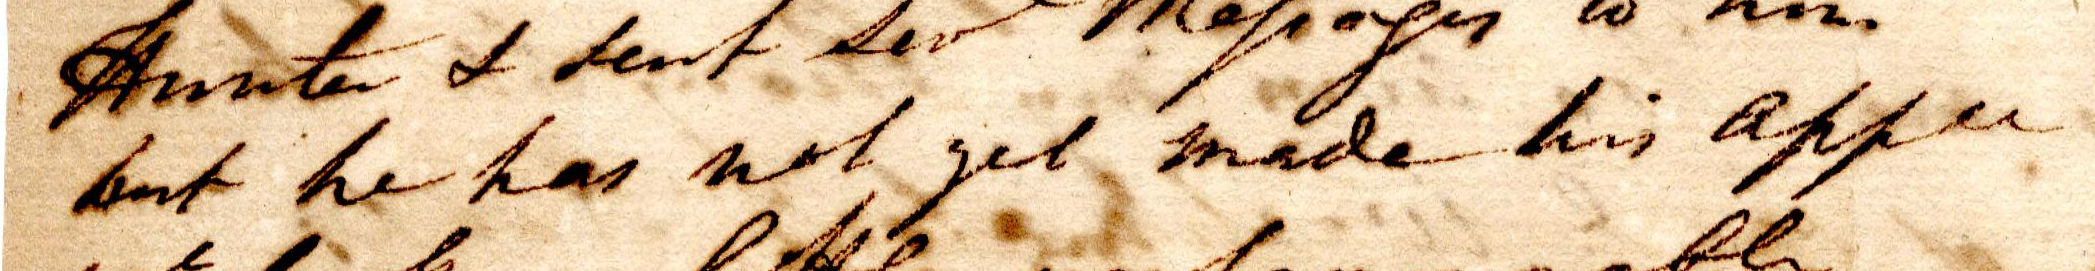but he has not yet made his apper
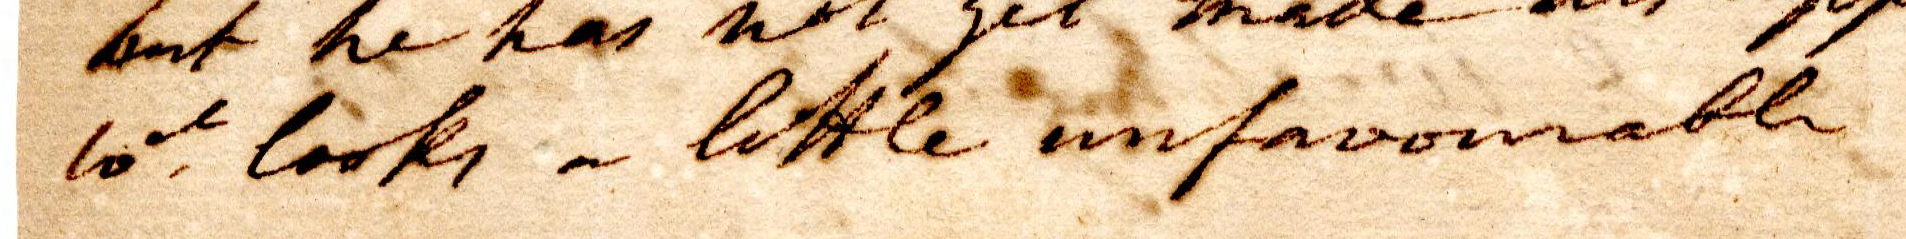to^y looks a little unfavourable
